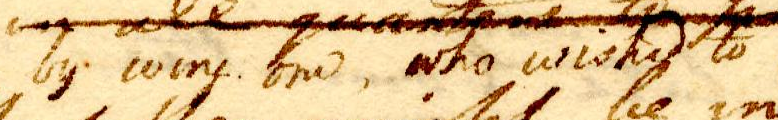by every one, who wishes to
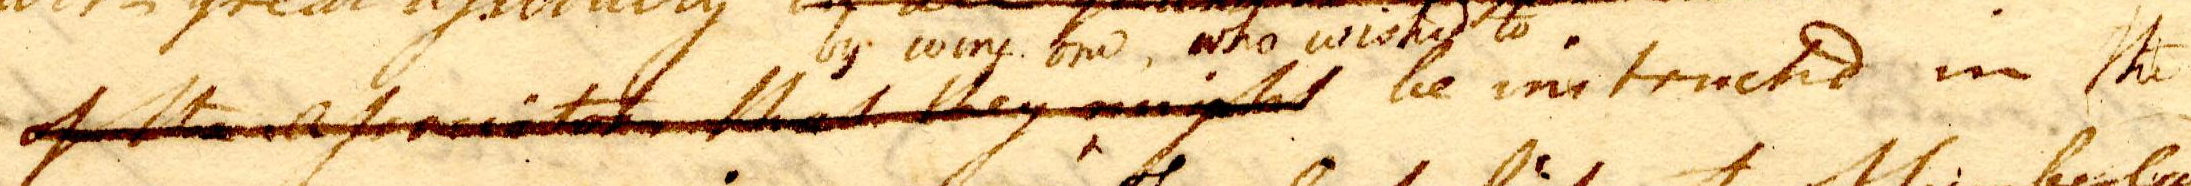[of its association that they might] be instructed in the
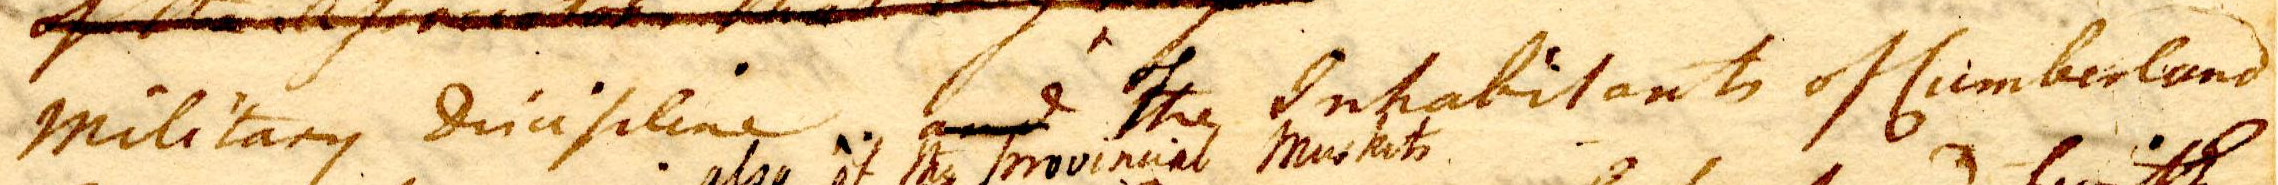Military Discipline [and] The Inhabitants of Cumberland
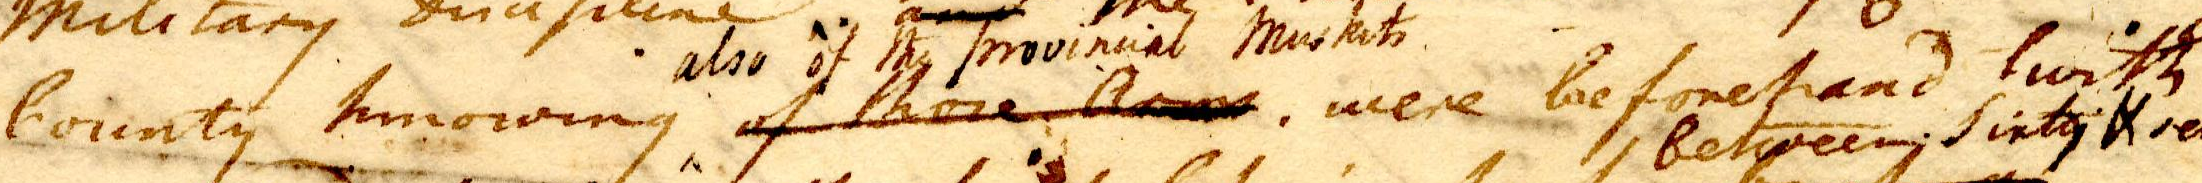County knowing ^ [of those Arms] were beforehand with
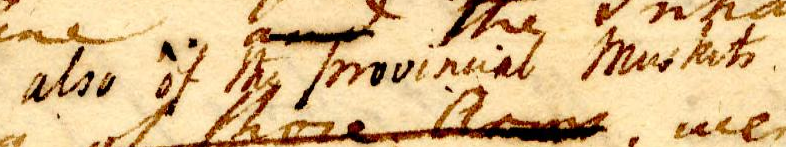also of the provincial Muskets
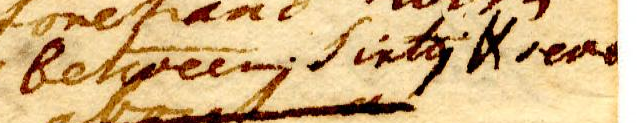between Sixty & sev
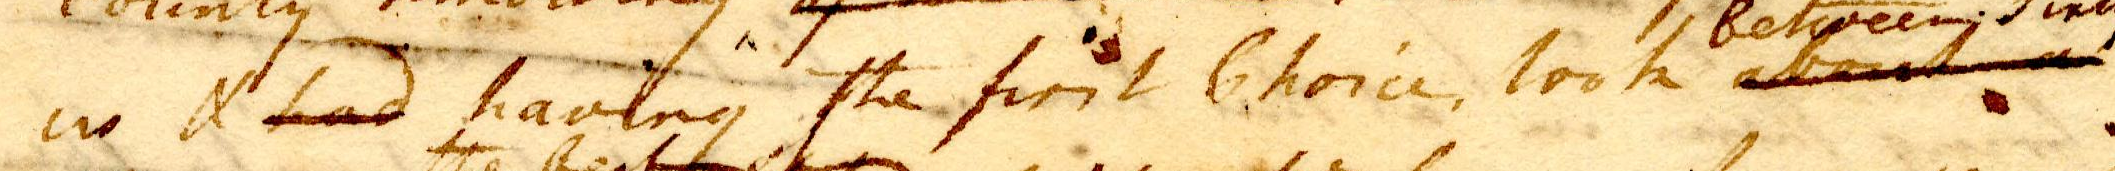us & [had] having the first Choice, look [about a]
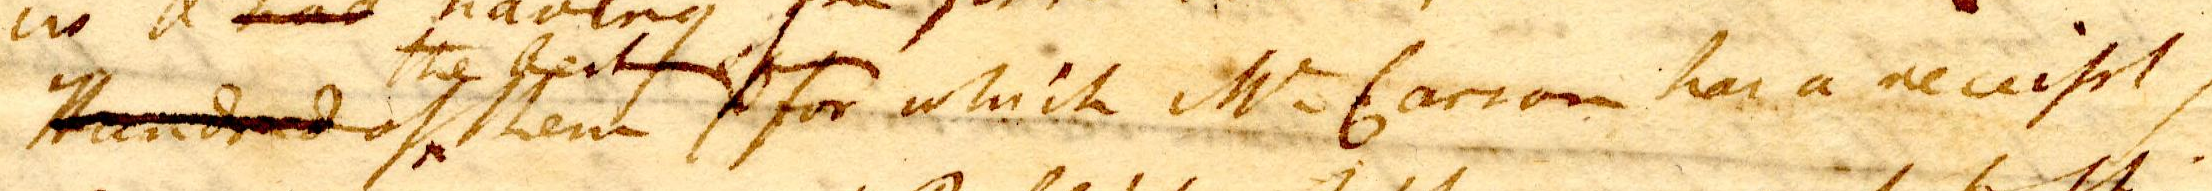[Hundred] of ^ them (for which M^r. Carson has a receipt)
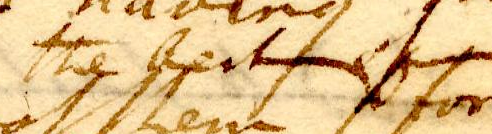the Act
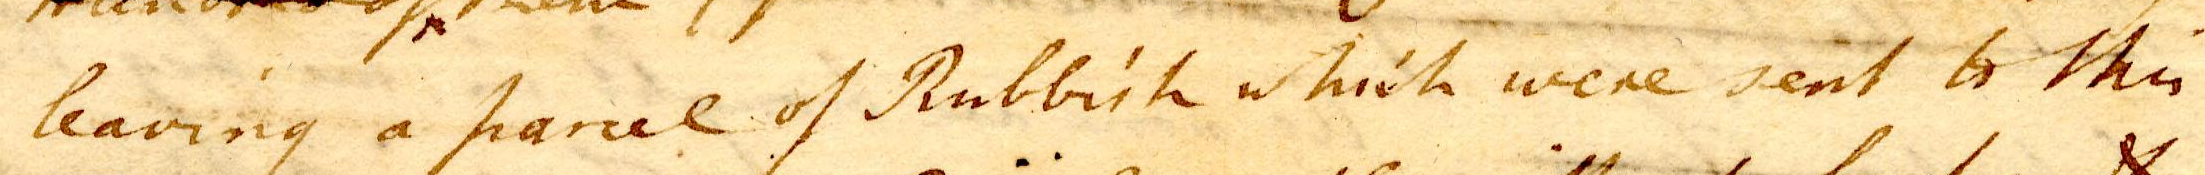leaving a parcel of Rubbish which were sent to this
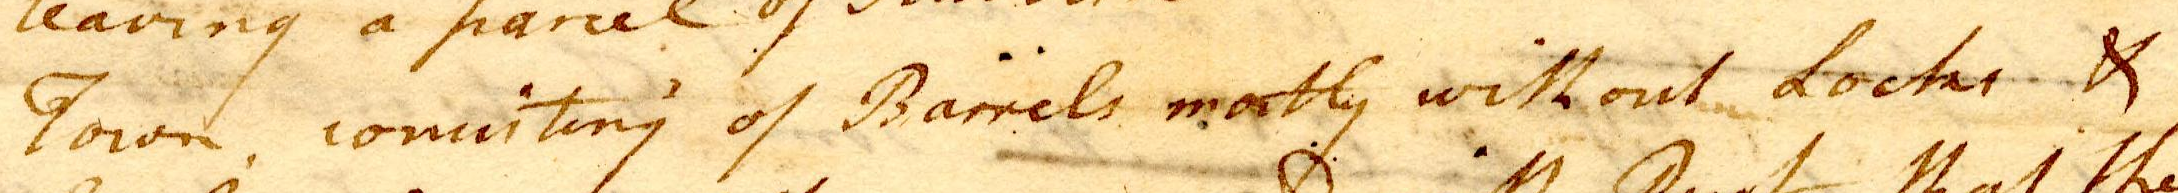Town, consisting of Barrels mostly without Locks &
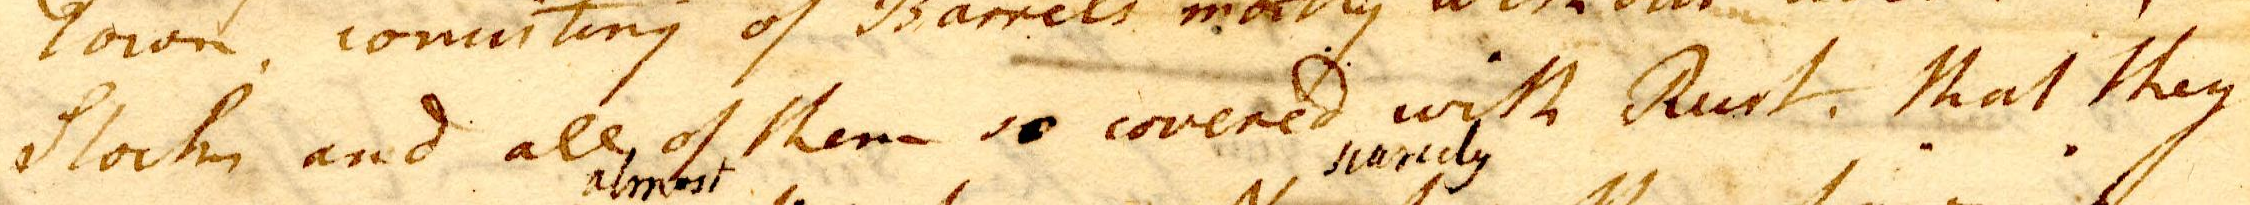Stocks and all of them so covered with Rust, that they
